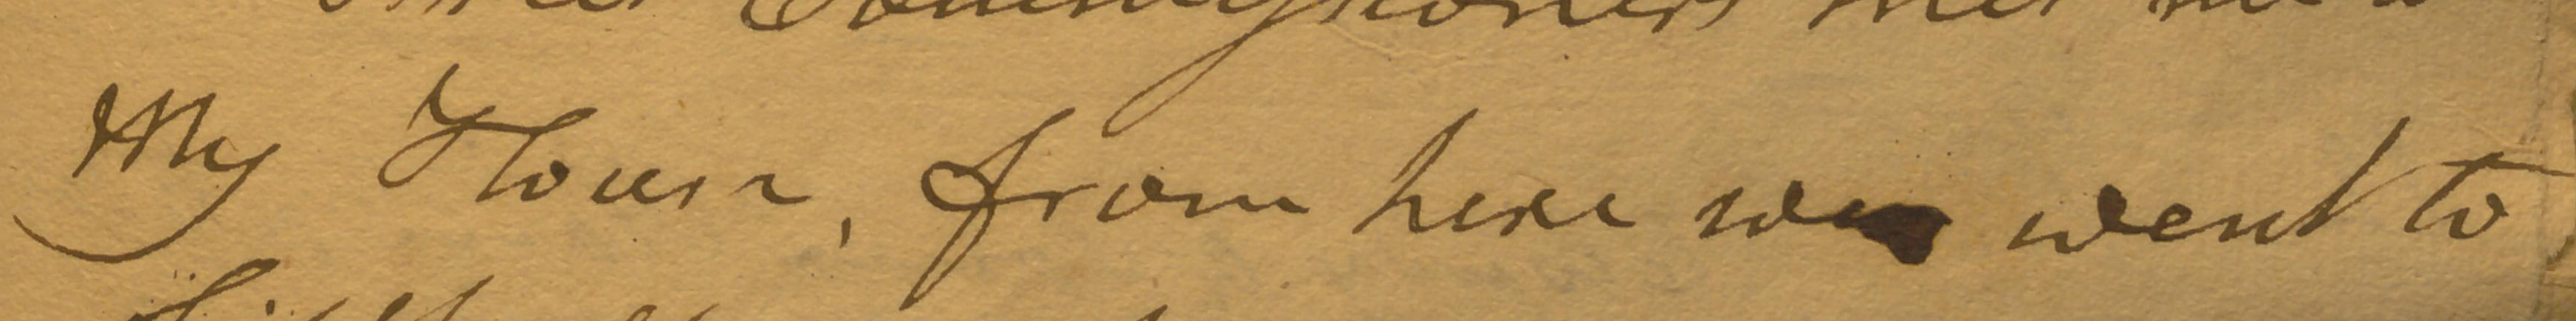My House from here we went to
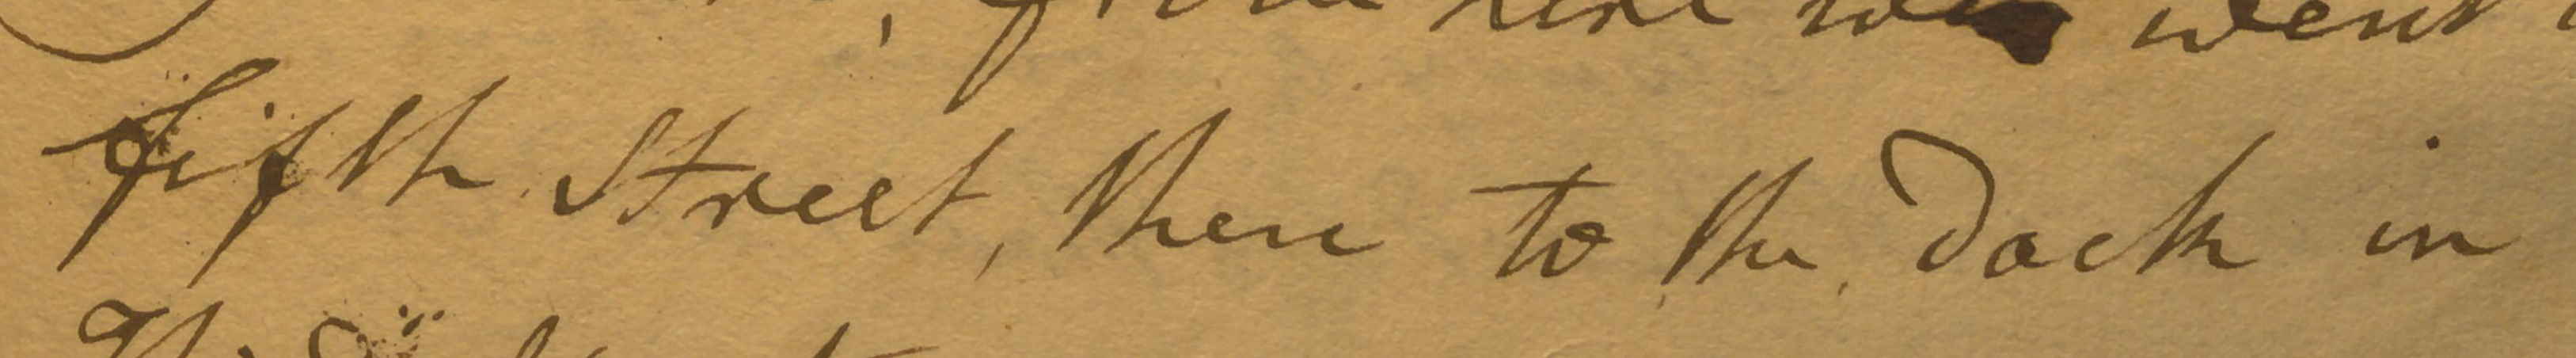fifth Street there to the dock in
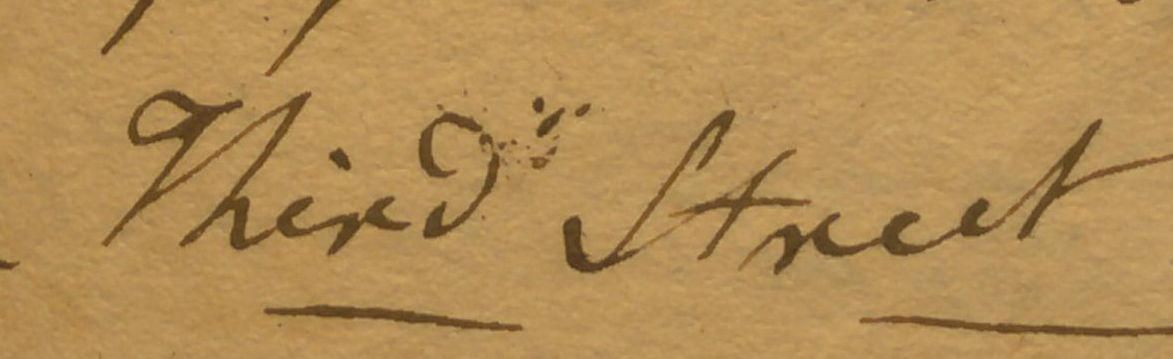Third Street
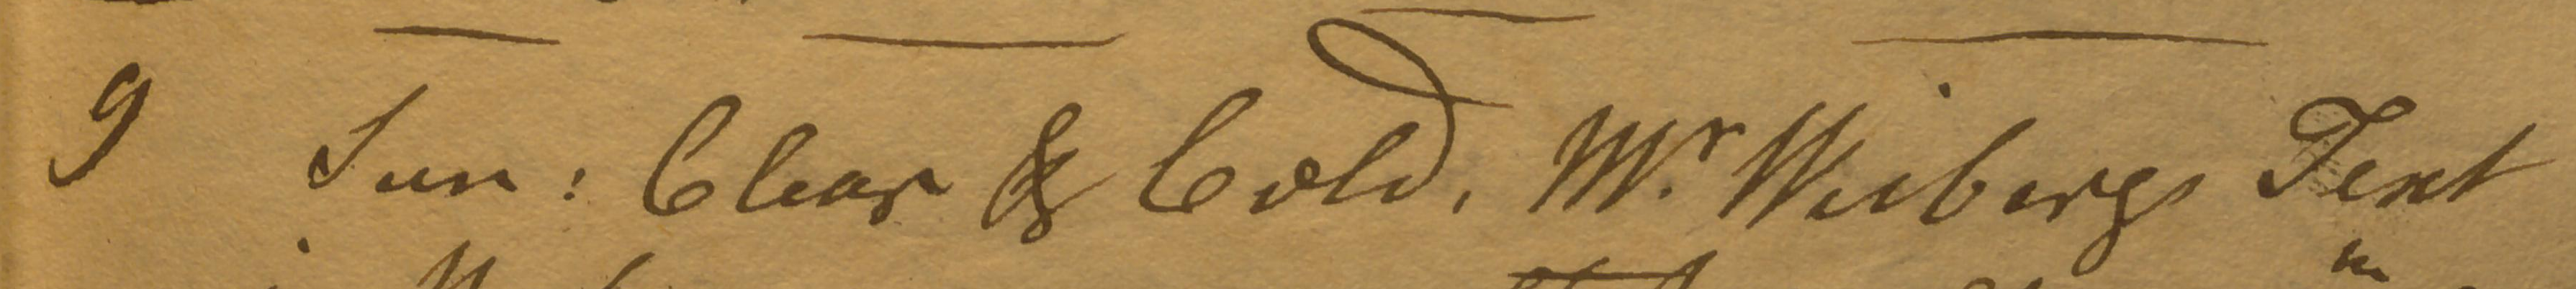9 Sun. Clear & Cold. M^r. Weibergs Text
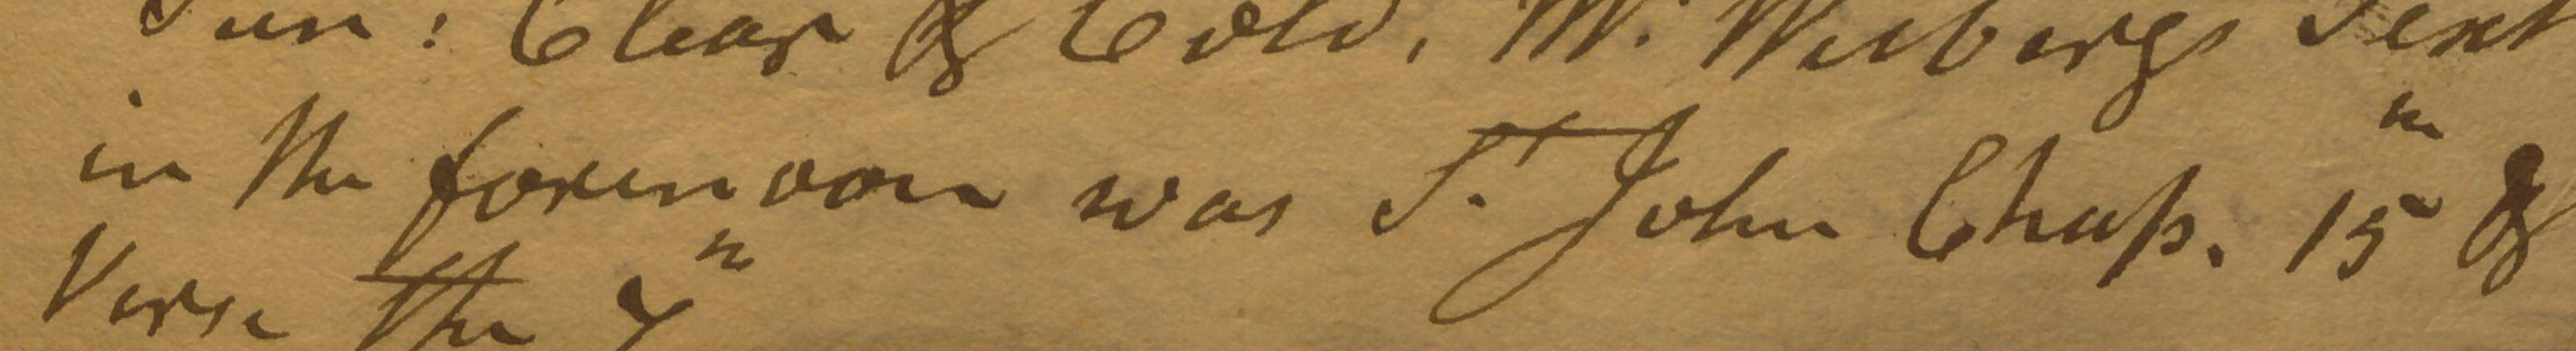in the forenoon was S^t. John Chap. 15^th &
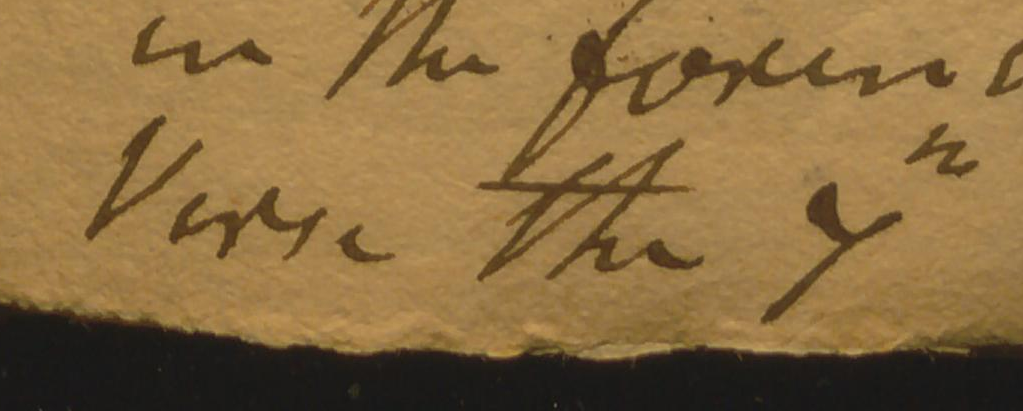Verse the 7^th
